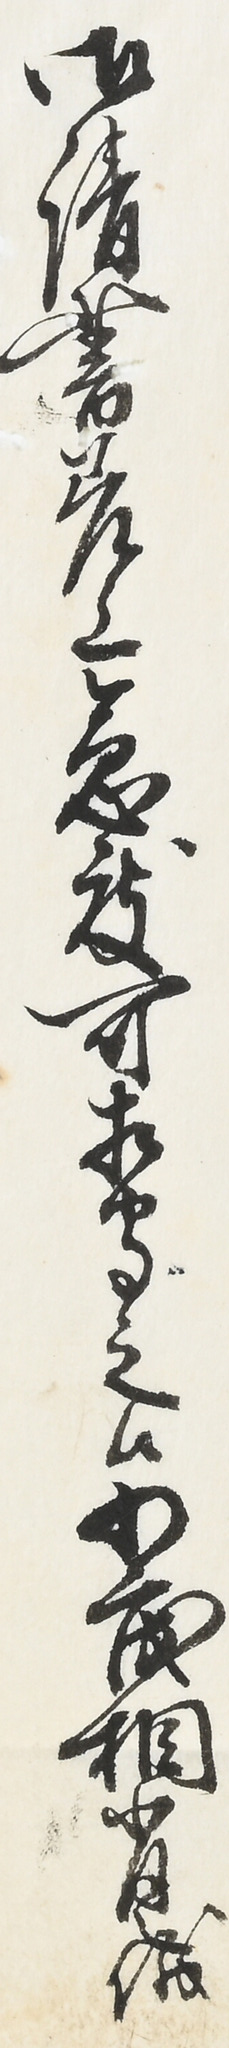御請書差上急度可相守之候少茂相背儀

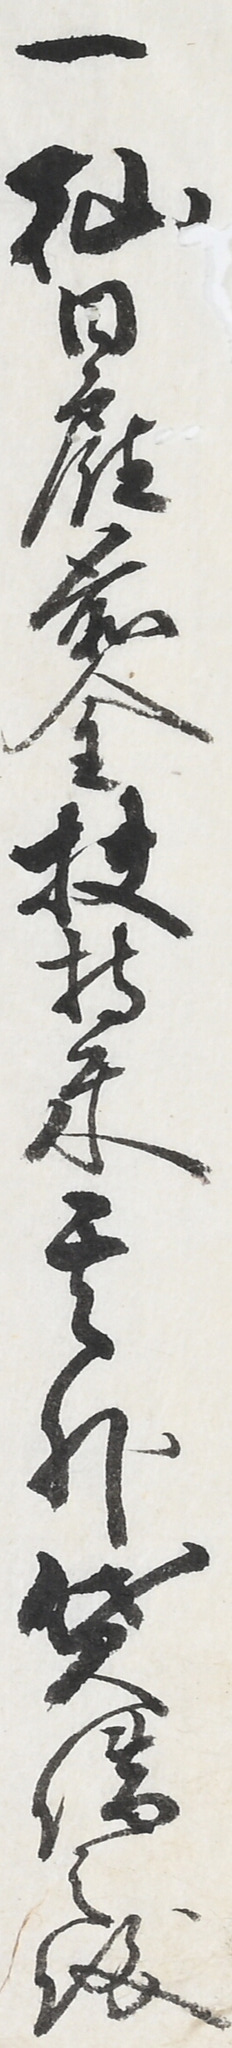一杣日雇前金扶持米其外貸借之儀
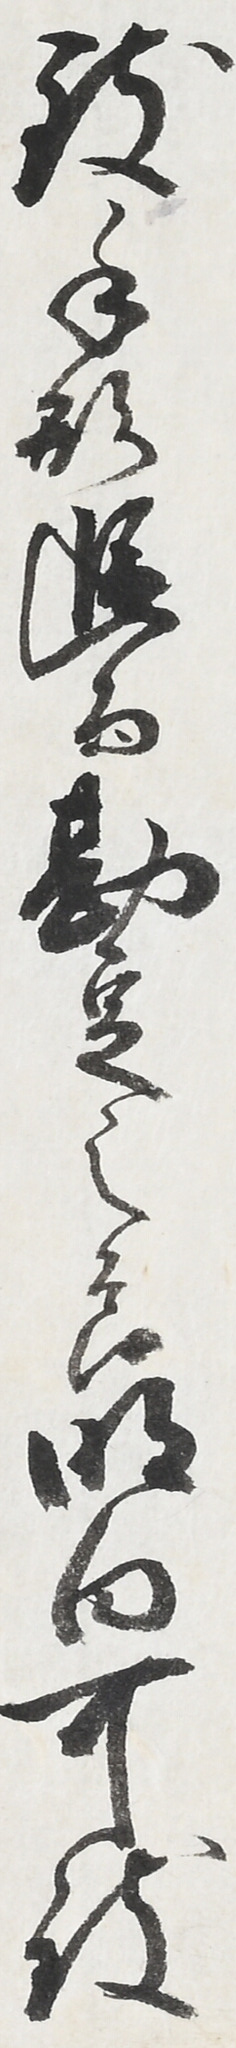致手形追而勘定之節明白可致
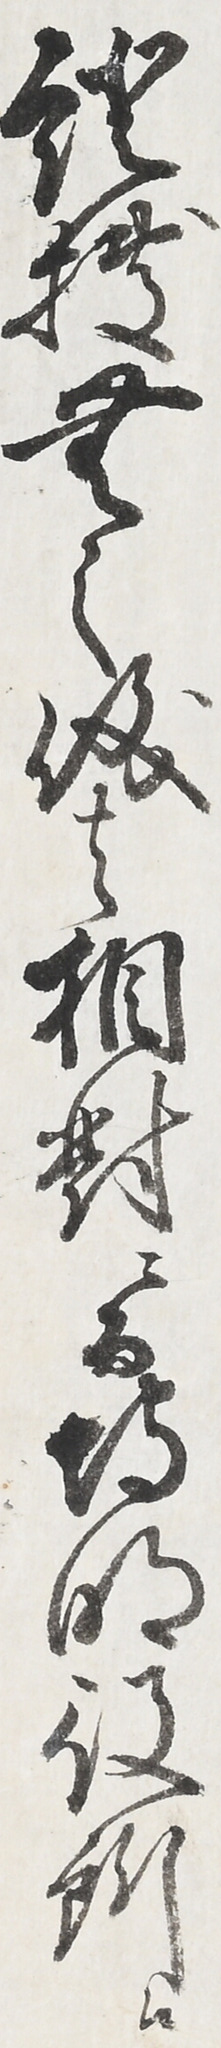証拠無之儀者相対ニ而埒明役所江
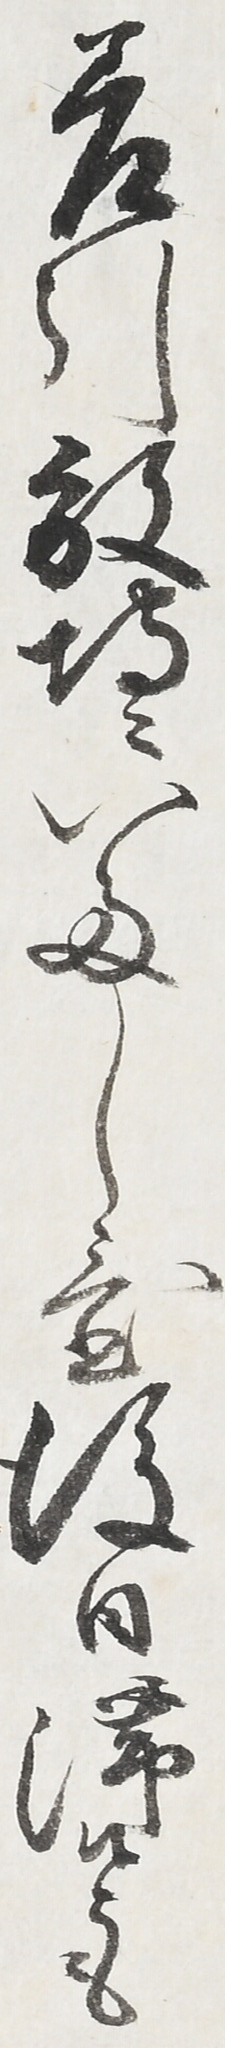差引放埒ニいたし置後日滞候とも
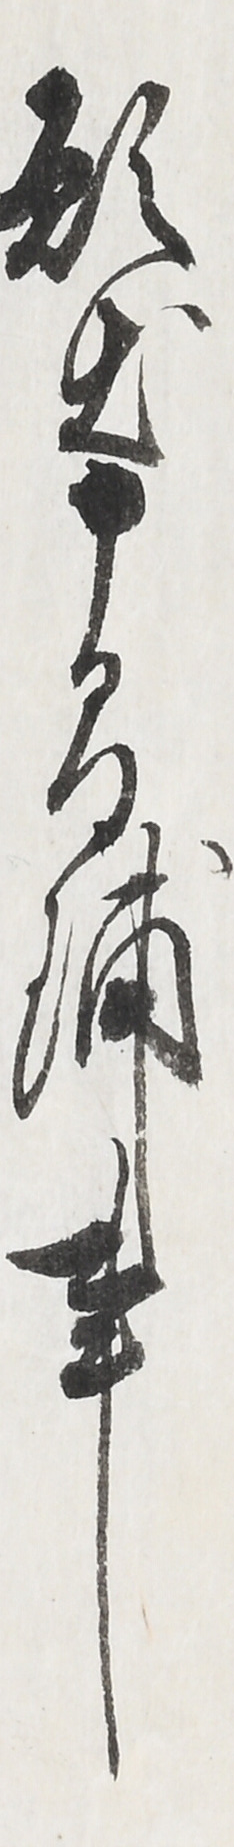願出申間敷事
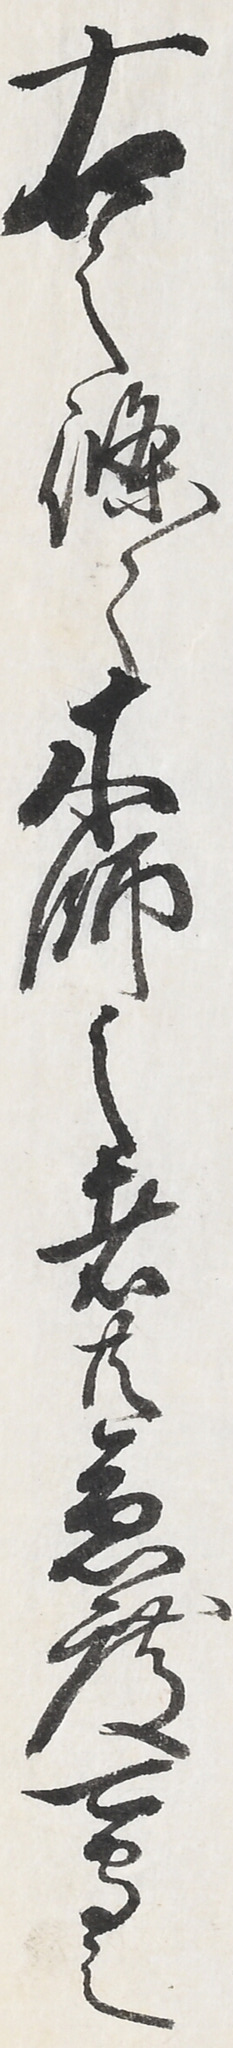右之條々木師之者共急度可守之
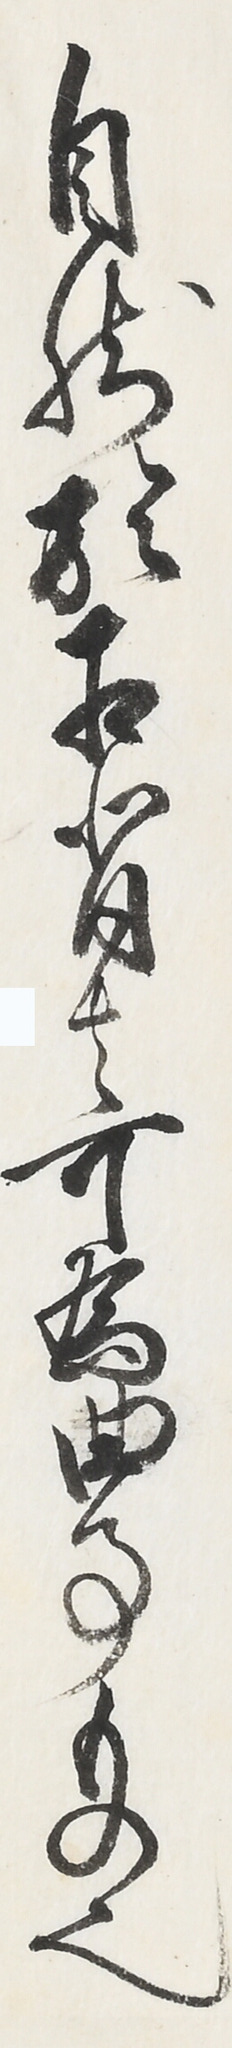自然於相背者可為曲事もの也
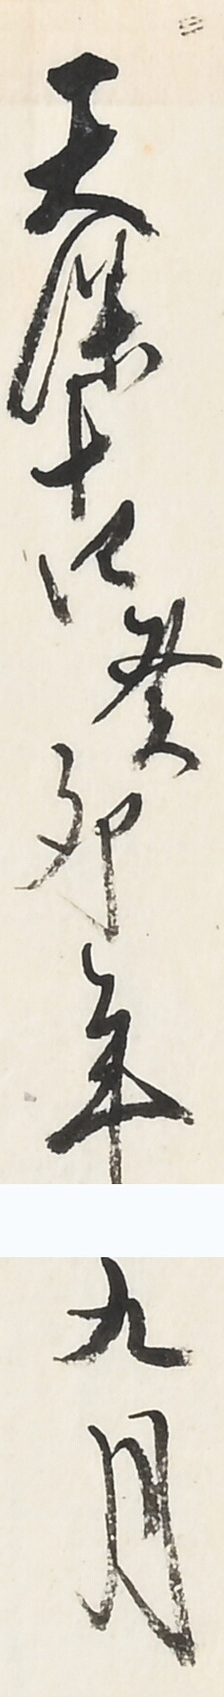天保十四癸卯年九月
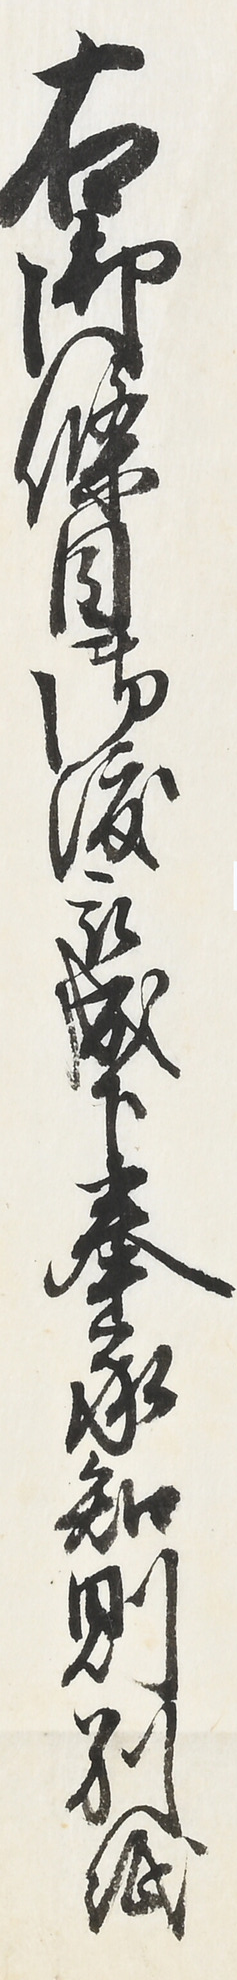右御條目御渡被成下奉承知則別紙
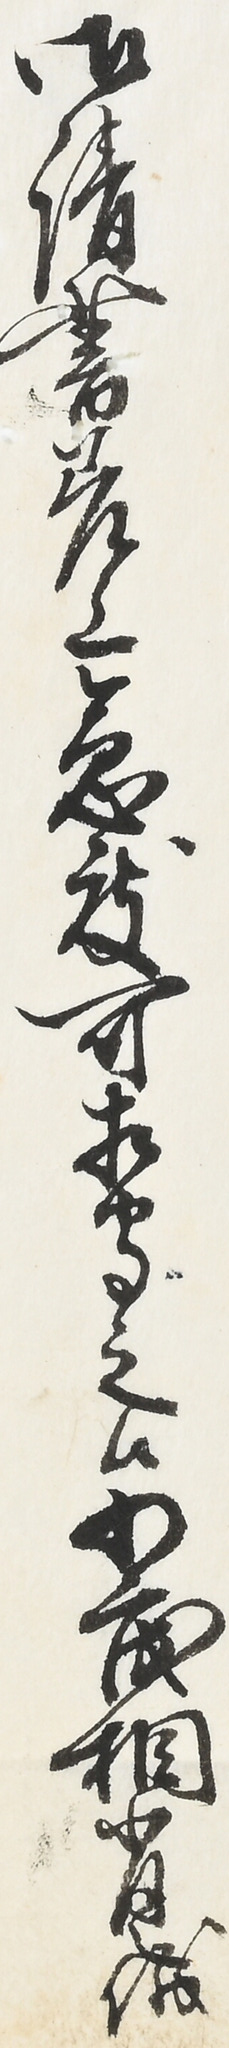請書差上急度可相守之候少茂相背儀

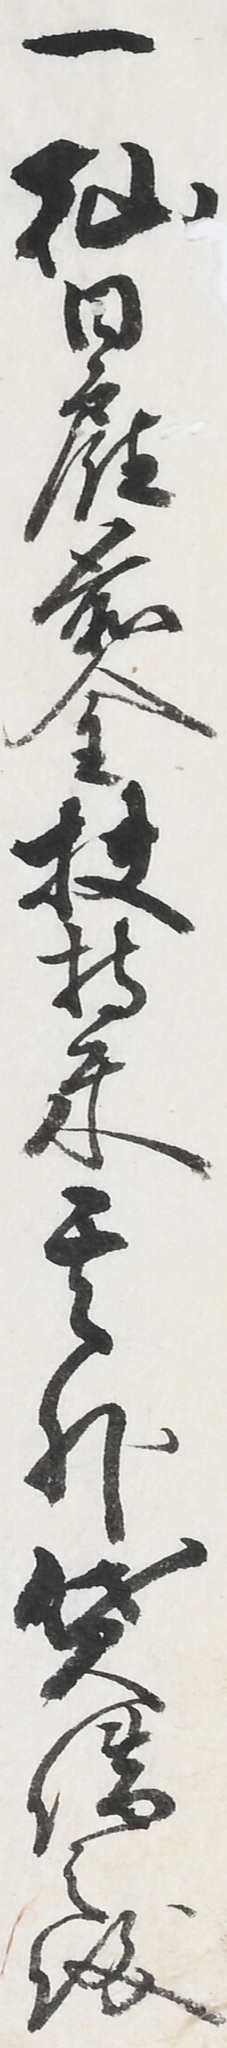一杣日雇前金扶持米其外貸借之儀
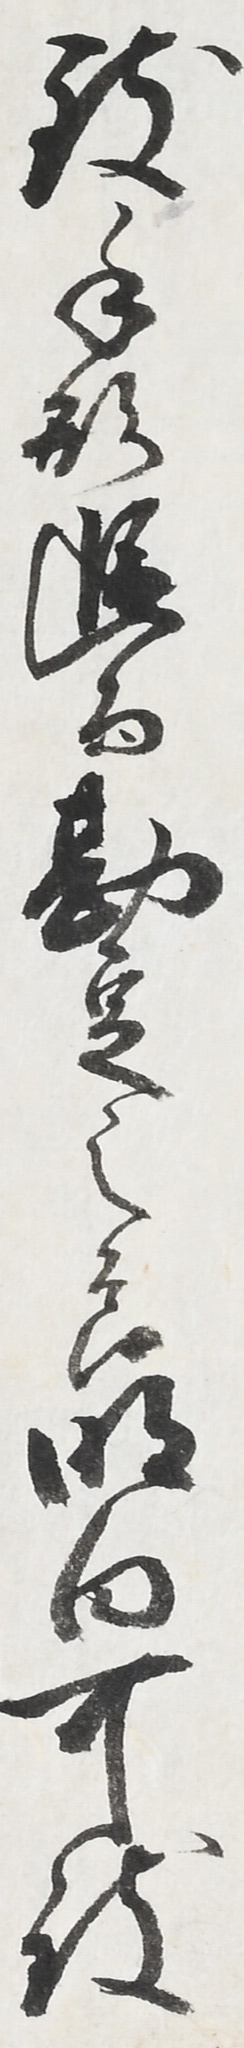致手形追而勘定之節明白可致
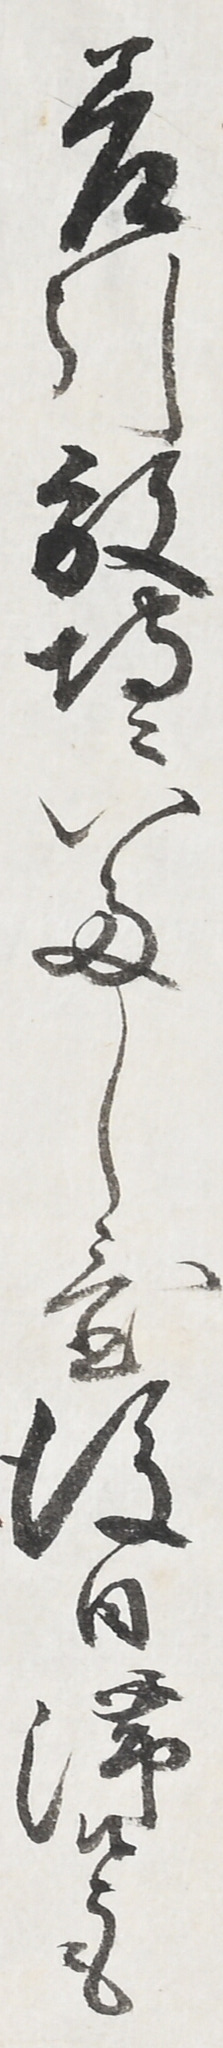差引放埒ニいたし置後日滞候とも
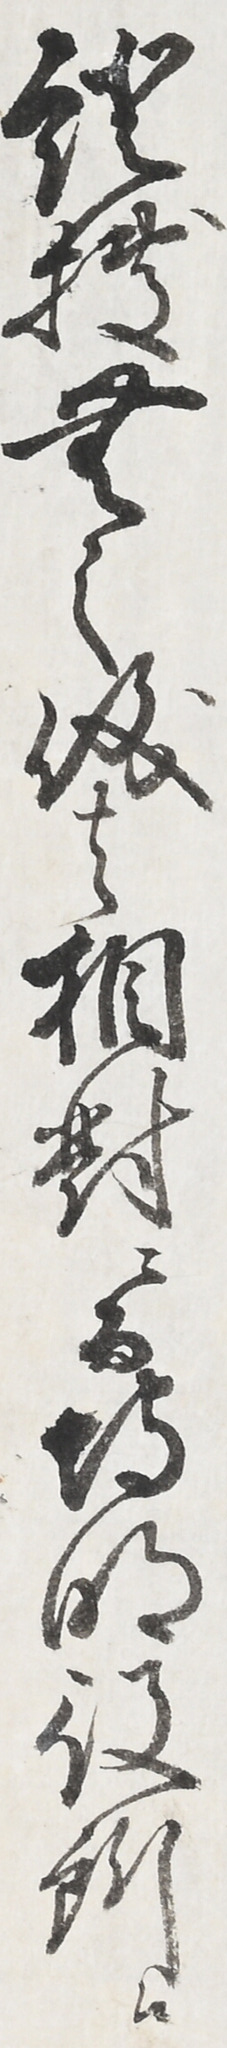証拠無之儀者相対ニ而埒明役所江
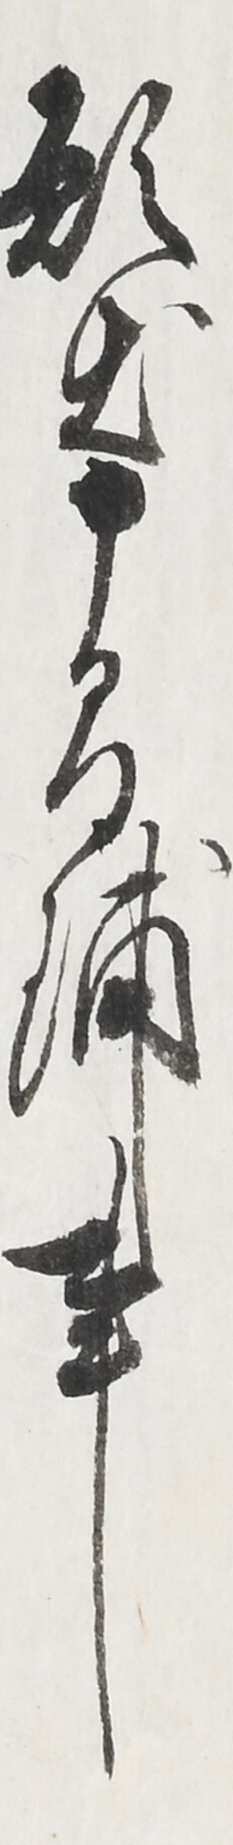願出申間敷事
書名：小白木條目請書并判取帳
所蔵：伊那市立高遠町図書館・合同会社AMANE
